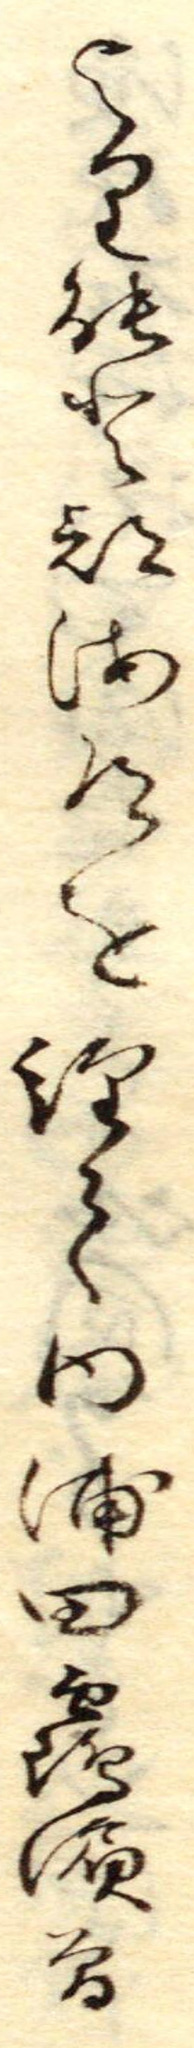より能登部海道を經て內浦田鶴濱曾

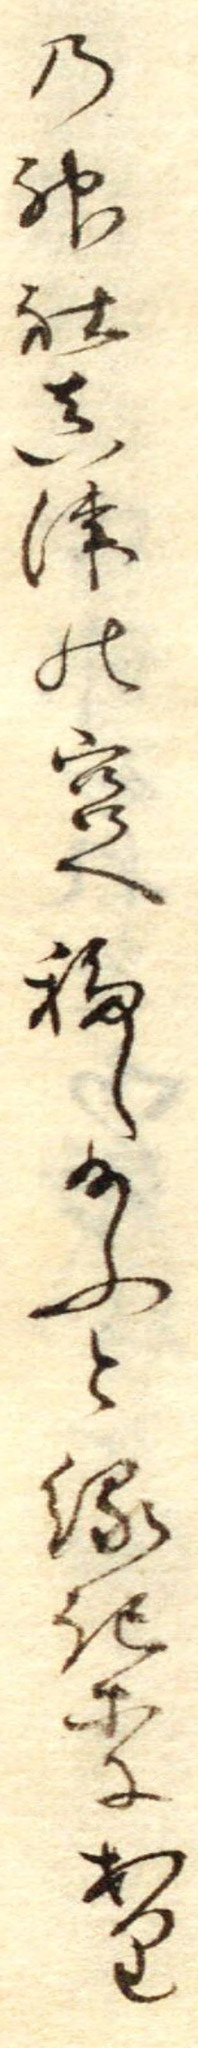の神社真津の宮へ移し給ふと縁起等にあり
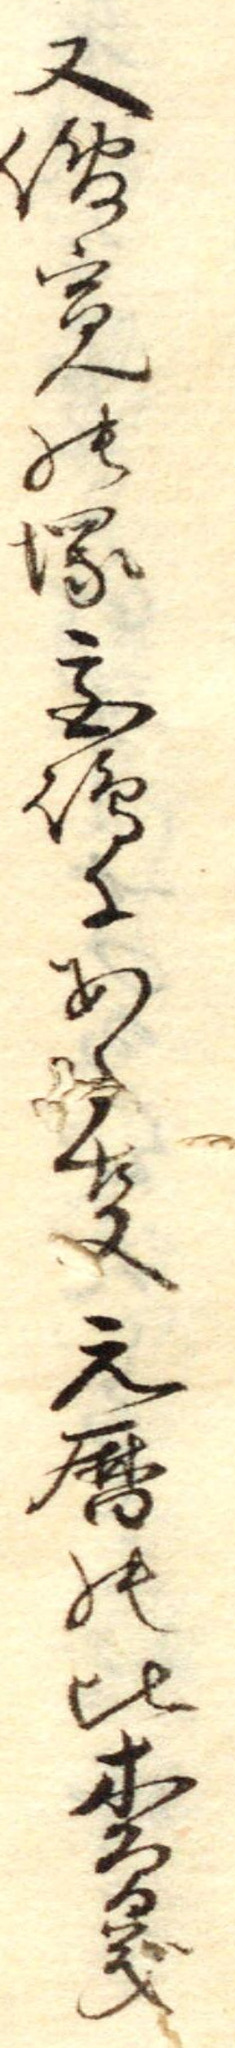又俊寛の塚宮嶋にある事元暦の比木曽義
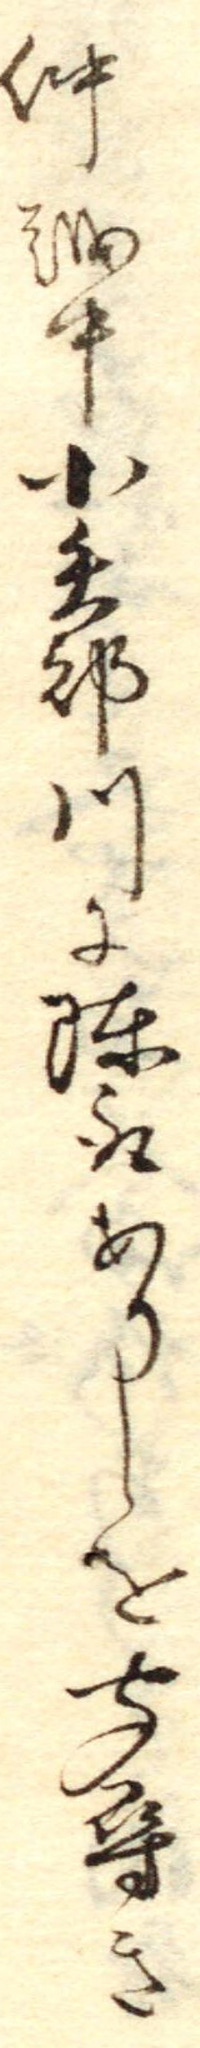仲越中小矢部川に陣取ありしを聞尋き
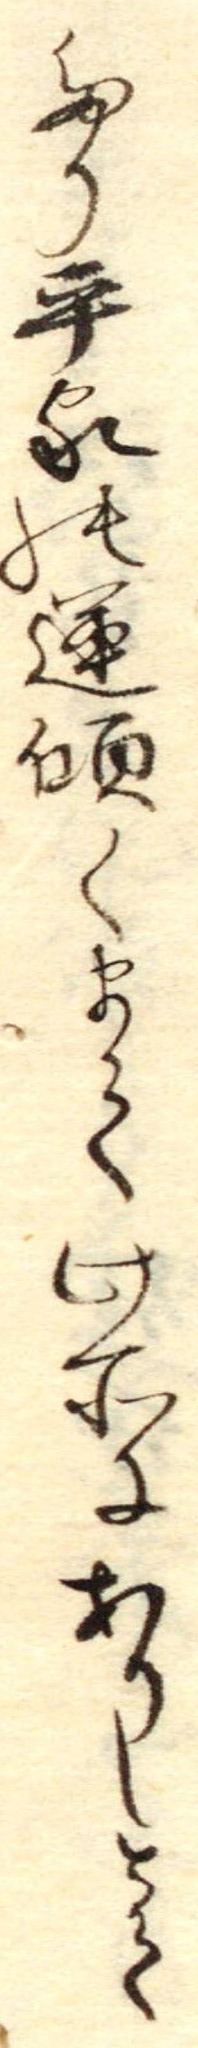たり平家の運傾くまて此所にありしとて
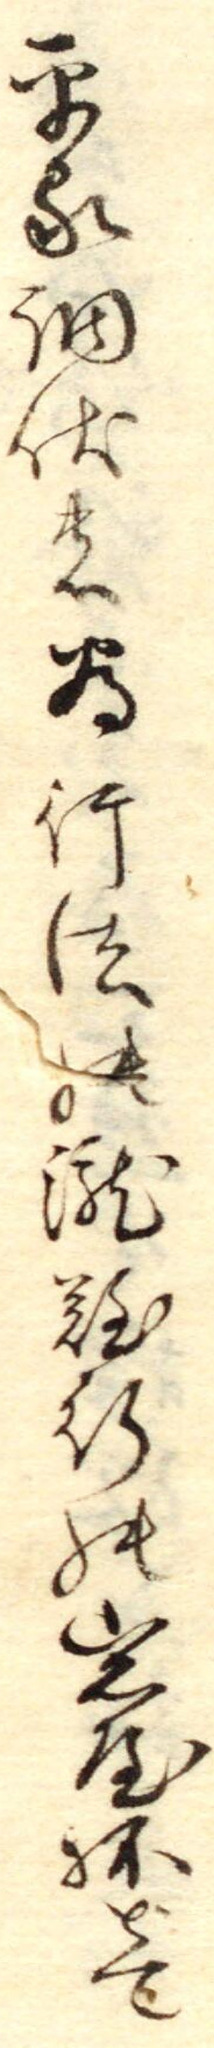平家調伏の為行法の瀧難行の岩屋抔とて
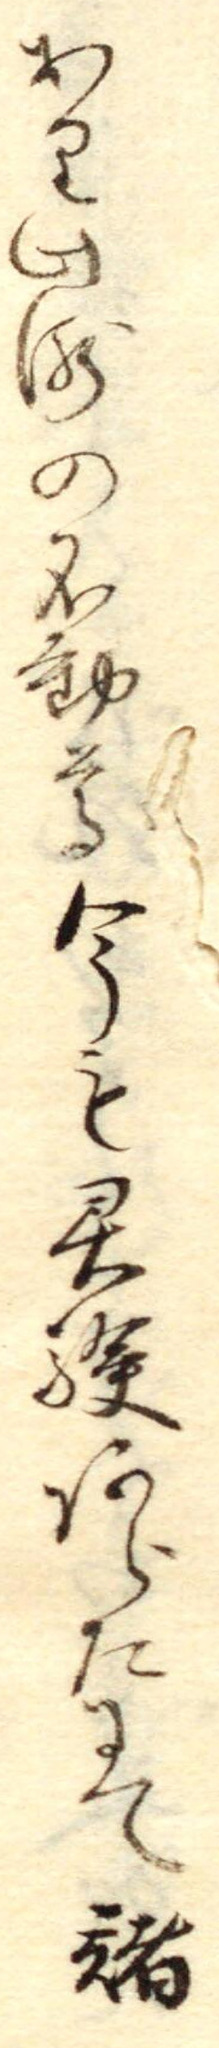あり此瀧の不動尊今も霊験あらたにて諸
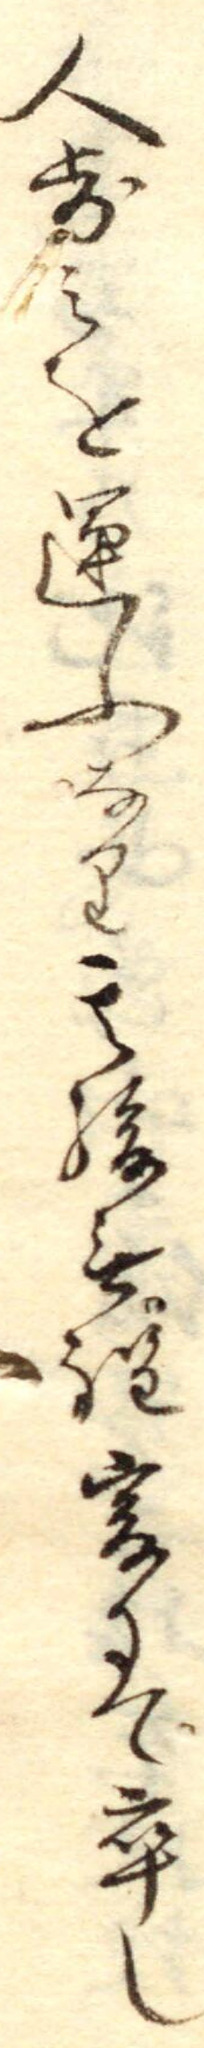人歩みを運ふなり其後無程爰にて卒し
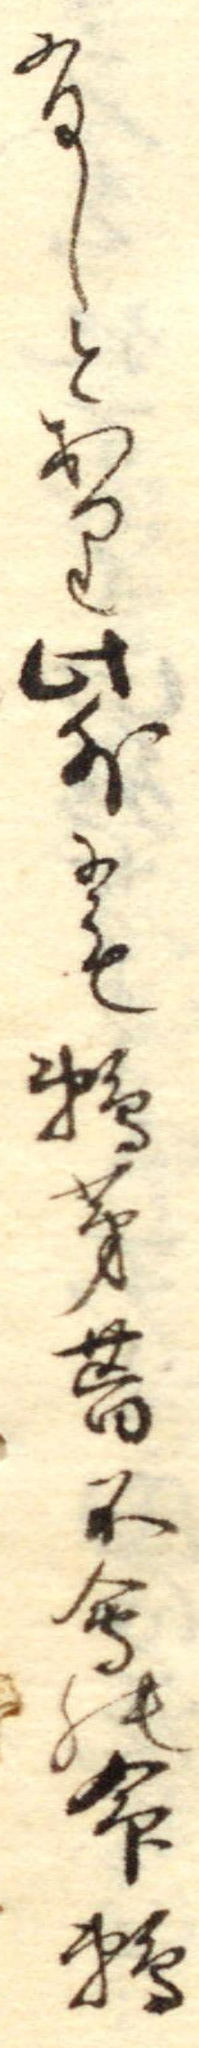有しとあり此外にも鵜茅葺不会の命鵜
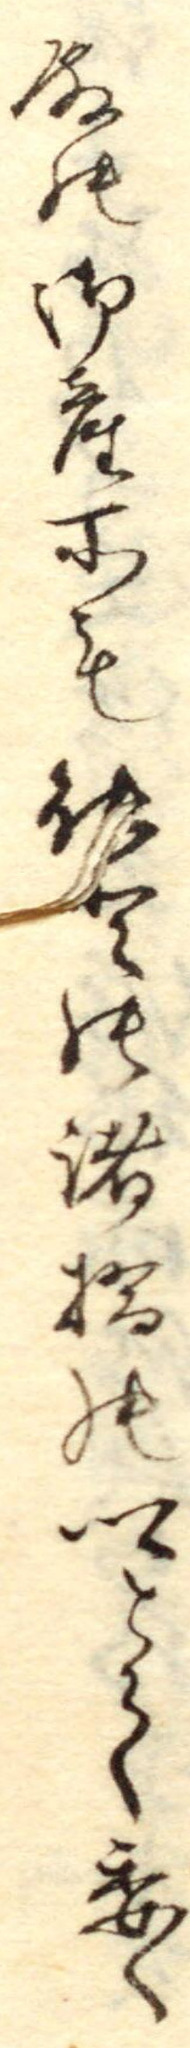殿の御産所も能登の諸橋の以とて委く
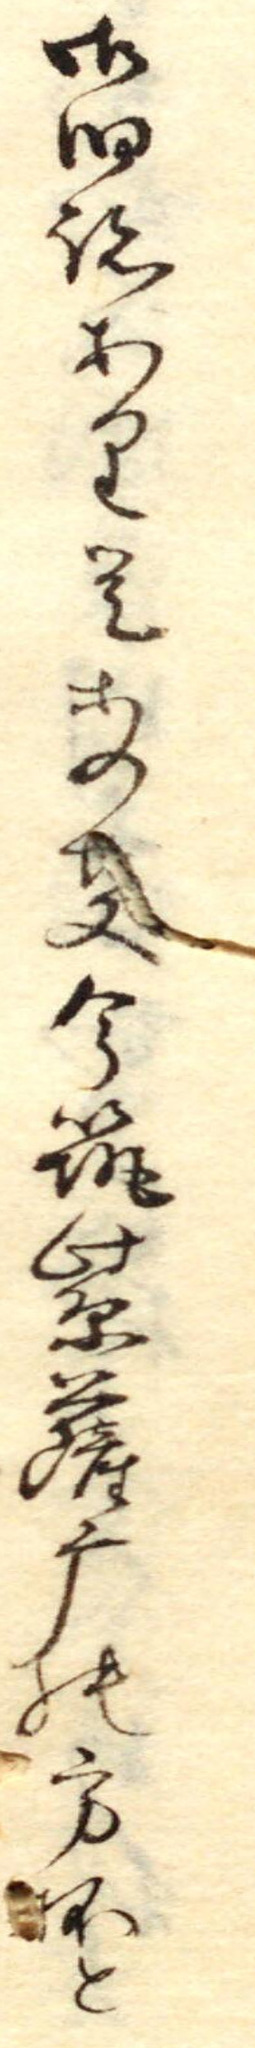御旧跡あり是等の事今筑紫薩摩の方抔と
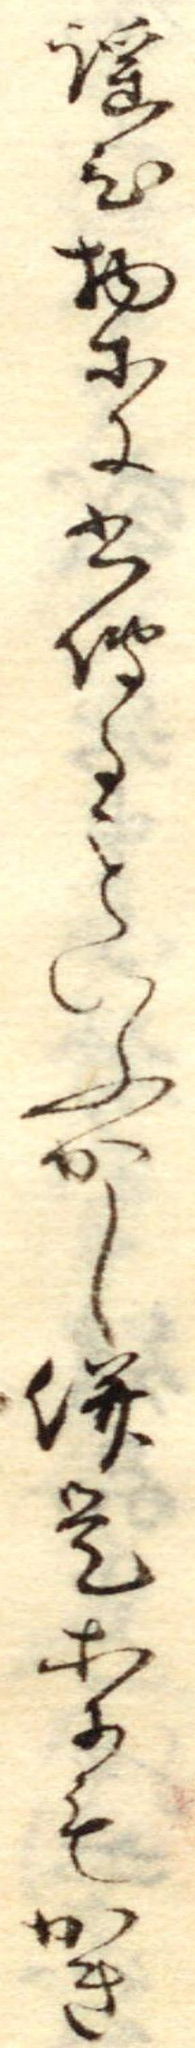謡ひ物等に書伝るといふかし併是等にもかき
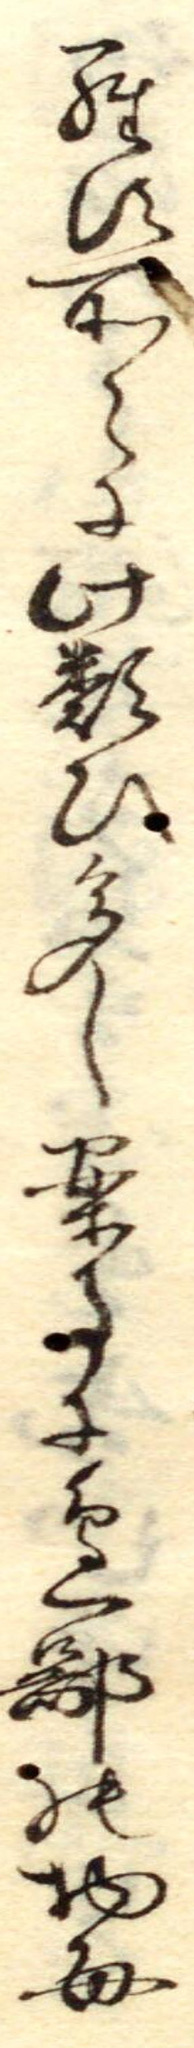らす所々に此類ひ多し案るに辺鄙の物毎
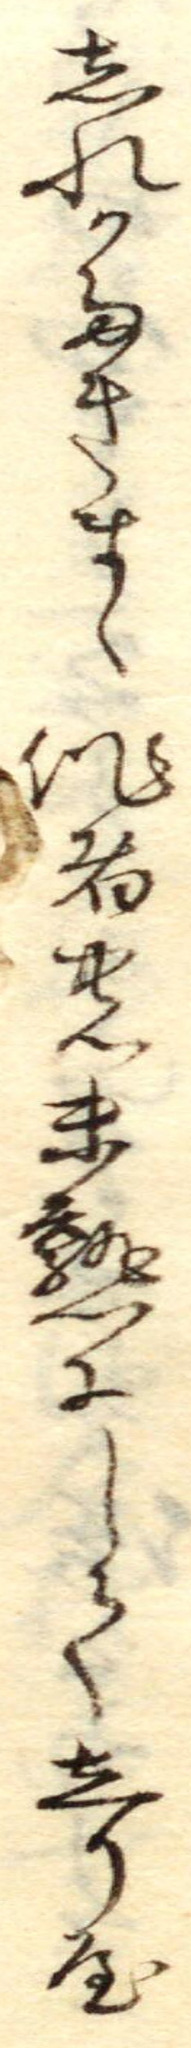しれかたきまゝ作者の未熟にしてしりや
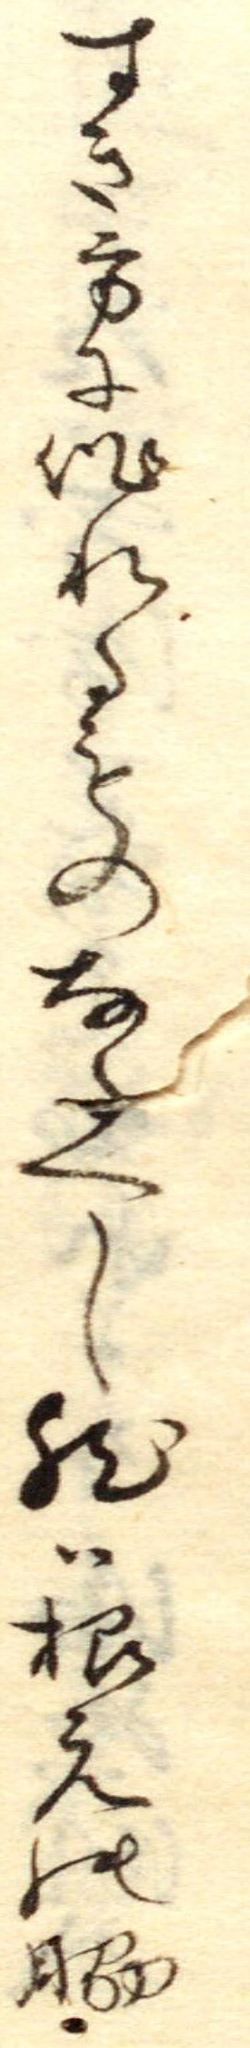すき方に作れるものなるへし然は根元之脇
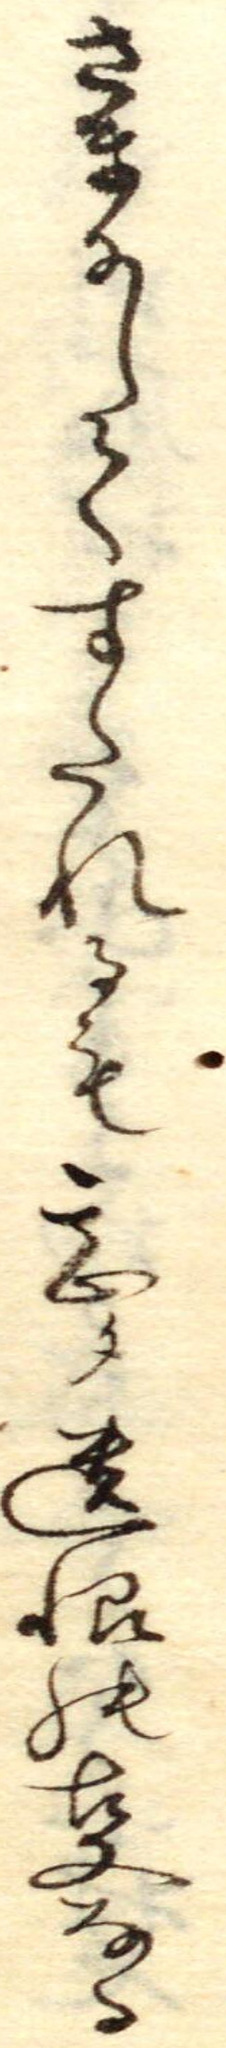さまにしてすたれるも甚た遺根の事なる
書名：能登名跡誌
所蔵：Ishikawa Prefectural Library
